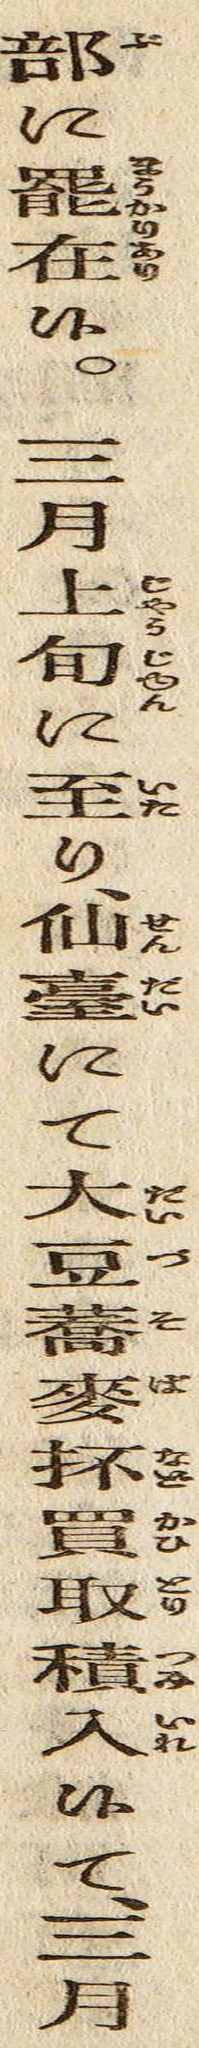部に罷在候。三月上旬に至り、仙台にて大豆蕎麦抔買取積入候て、三月
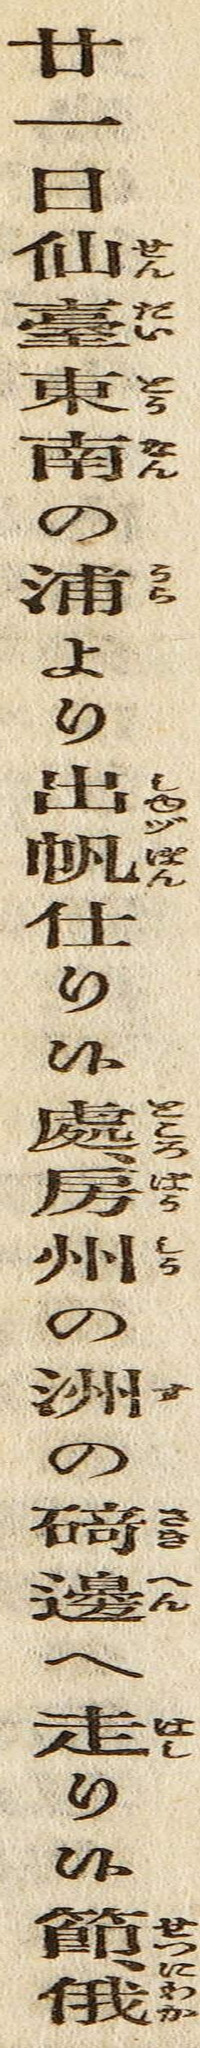廿一日仙台東南の浦より出帆仕り候処、房州の洲の埼辺へ走り候節、俄
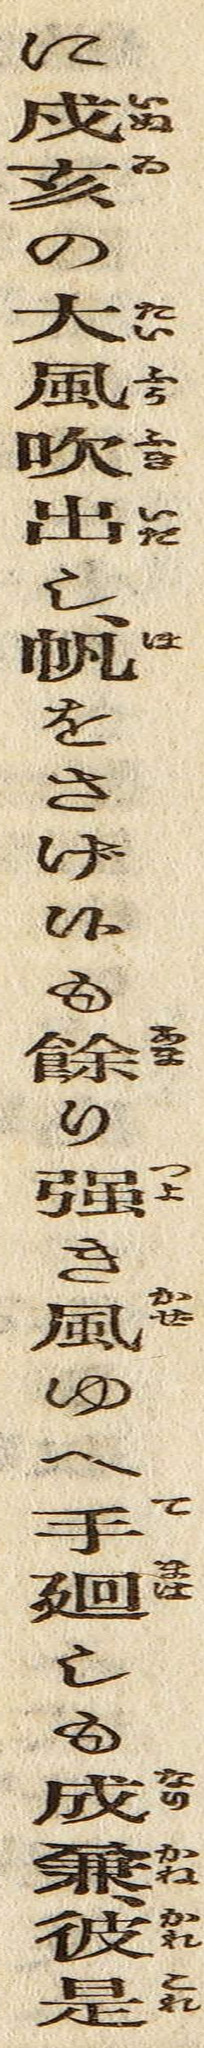に戌亥の大風吹出し、帆をさげ候も余り強き風ゆへ手廻しも成兼、彼是
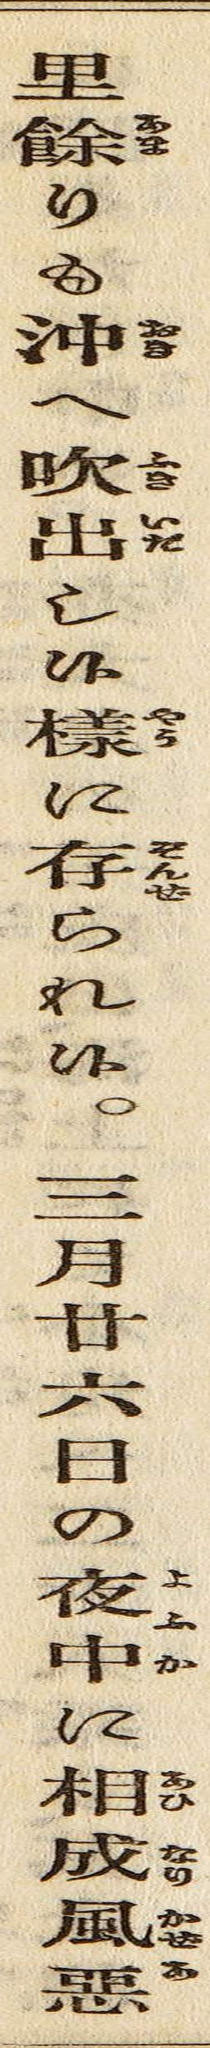里余りも沖へ吹出し候様に存られ候。三月廿六日の夜中に相成風悪
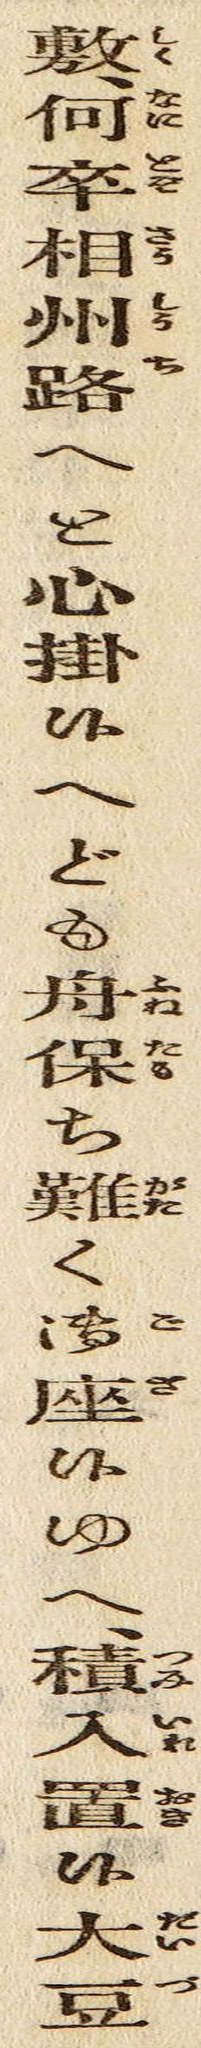敷、何卒相州路へと心掛候へども舟保ち難く御座候ゆへ、積入置候大豆
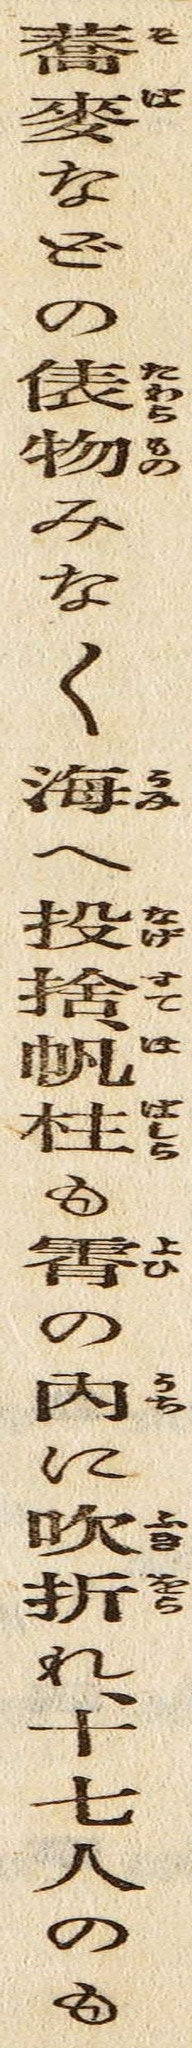蕎麦などの俵物みな〳〵海へ投捨、帆柱も霄の内に吹折れ、十七人のも
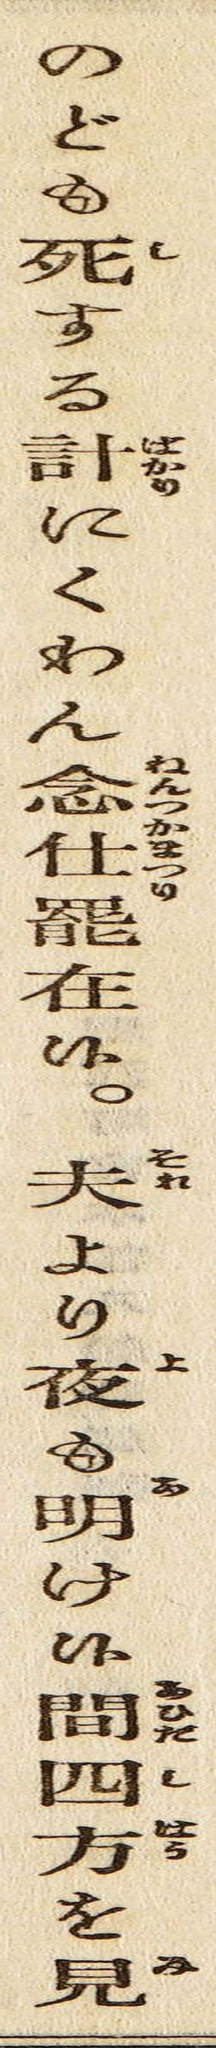のども死する計にくわん念仕罷在候。夫より夜も明け候間四方を見
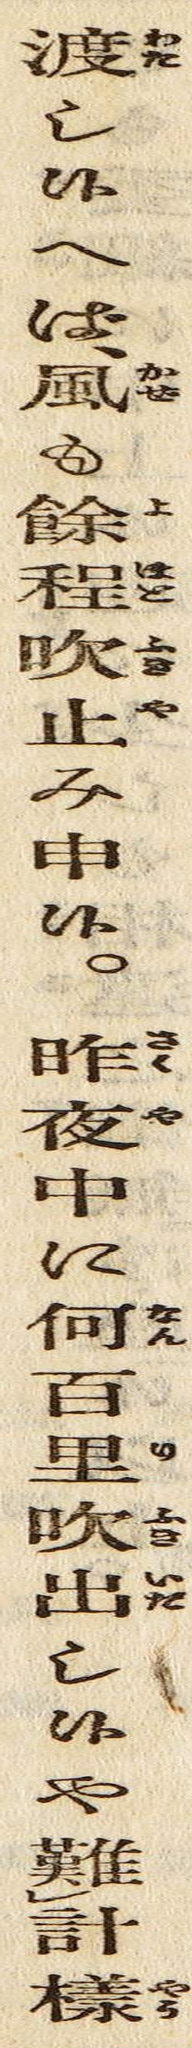渡し候へば、風も余程吹止み申候。昨夜中に何百里吹出し候や難計様
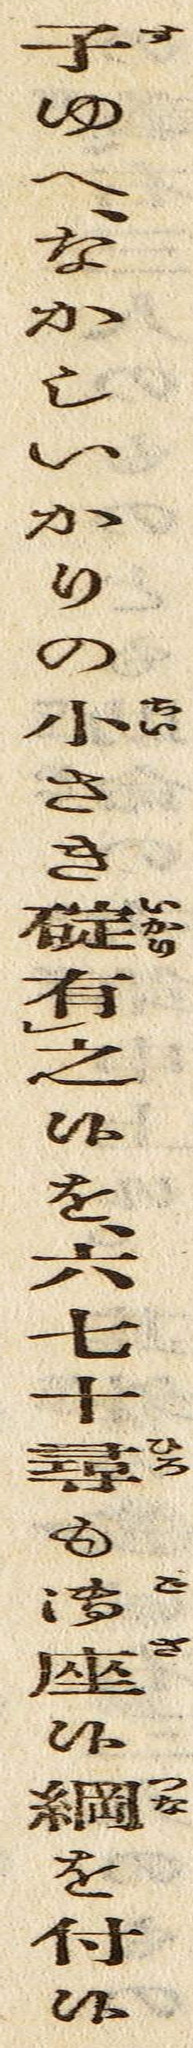子ゆへ、なかしいかりの小さき碇有之候を、六七十尋も御座候綱を付候
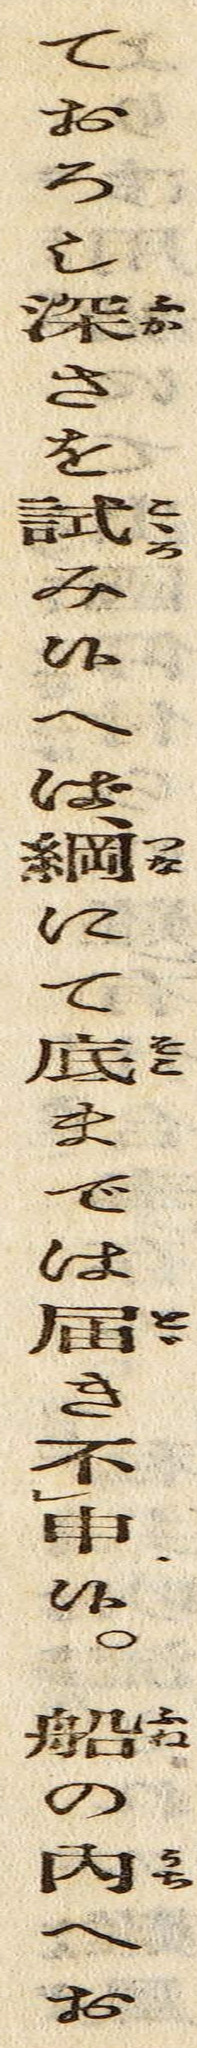ておろし深さを試み候へば、綱にて底までは届き不申候。船の内へお
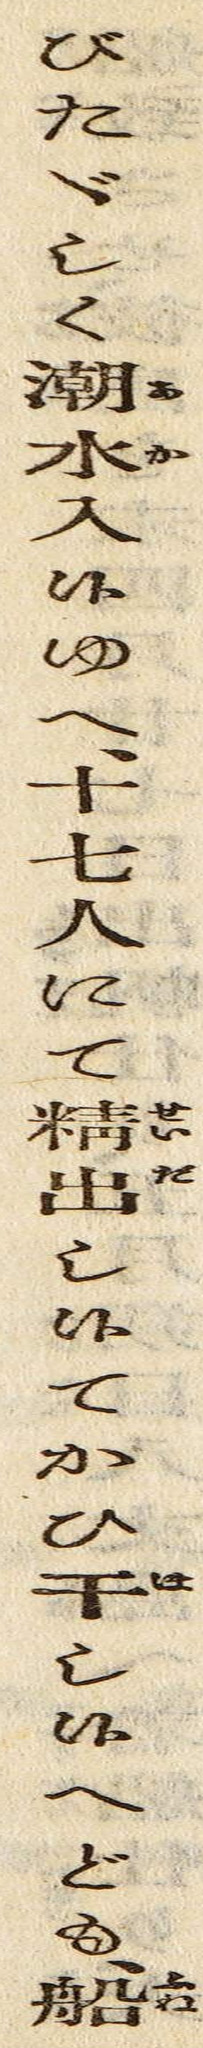びたヾしく潮水入候ゆへ、十七人にて精出し候てかひ干し候へども、船
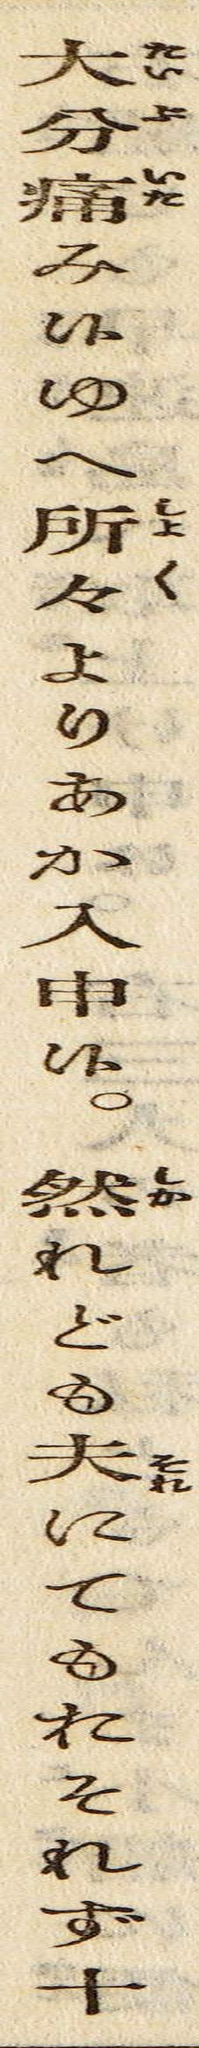大分痛み候ゆへ所々よりあか入申候。然れども夫にてもおそれず十
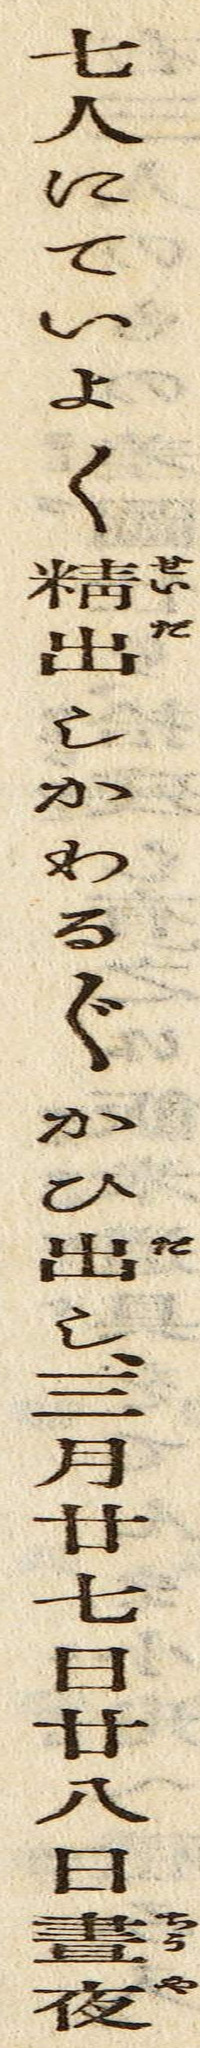七人にていよ〳〵精出しかわる〴〵かひ出し、三月廿七日廿八日昼夜
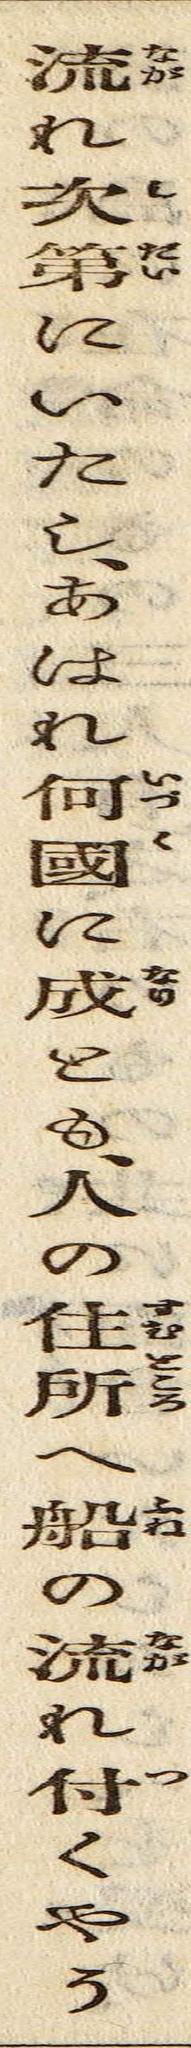流れ次第にいたし、あはれ何国に成とも、人の住所へ船の流れ付くやう
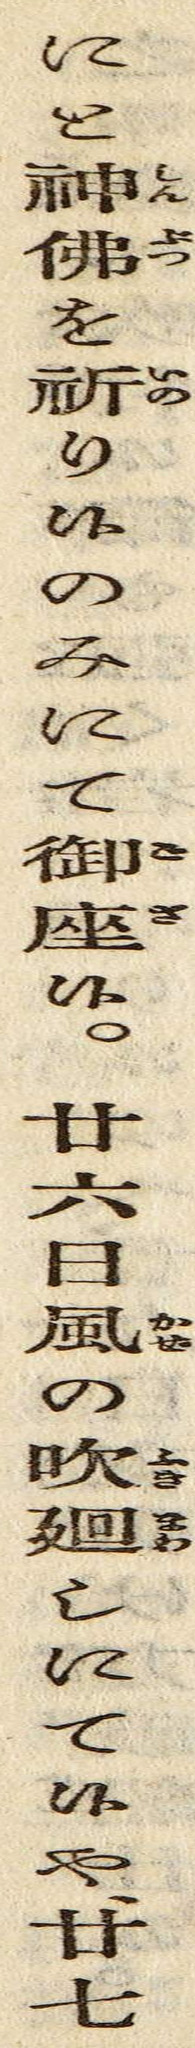にと神仏を祈り候のみにて御座候。廿六日風の吹廻しにて候や、廿七
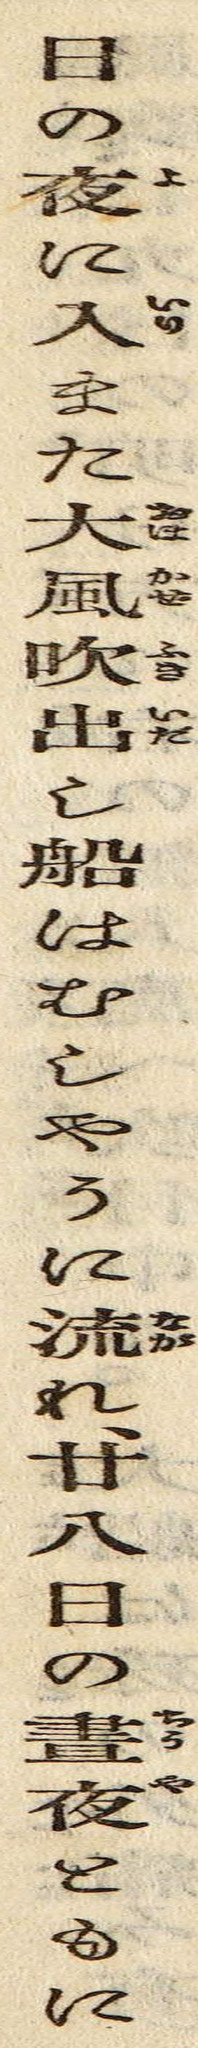日の夜に入また大風吹出し船はむしやうに流れ、廿八日の昼夜ともに
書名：日本漂流譚
